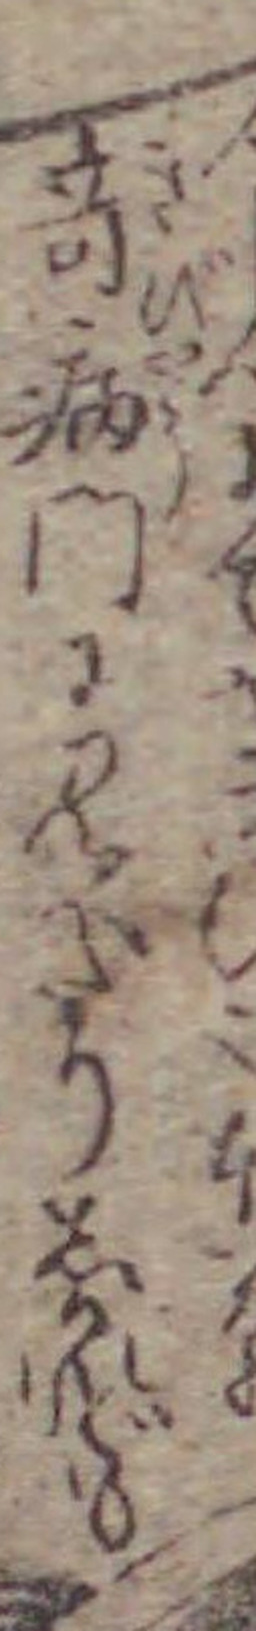奇病門に見へたりしかれども
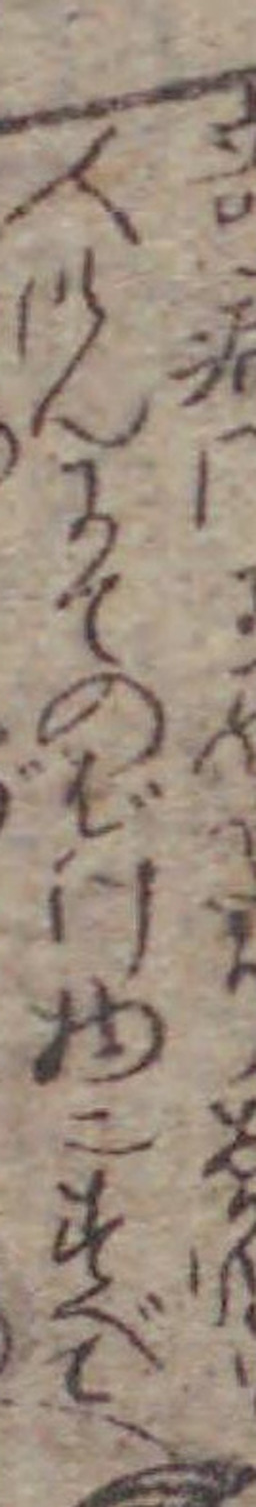人けんにてのばけ物にすべて
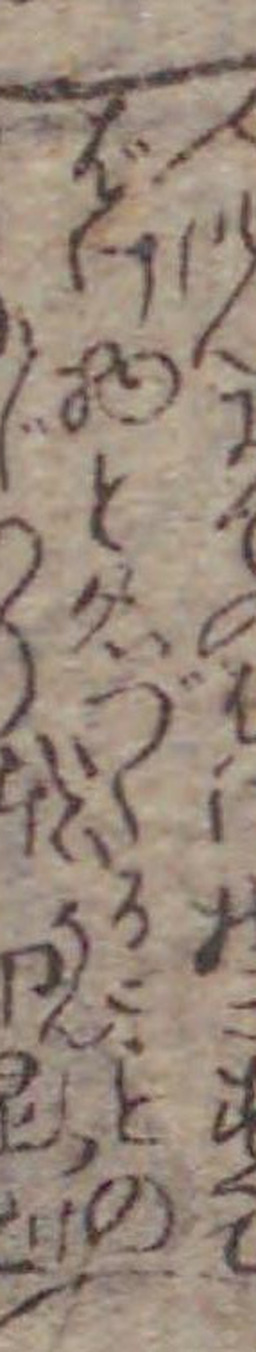ばけ物と名づくるにことの
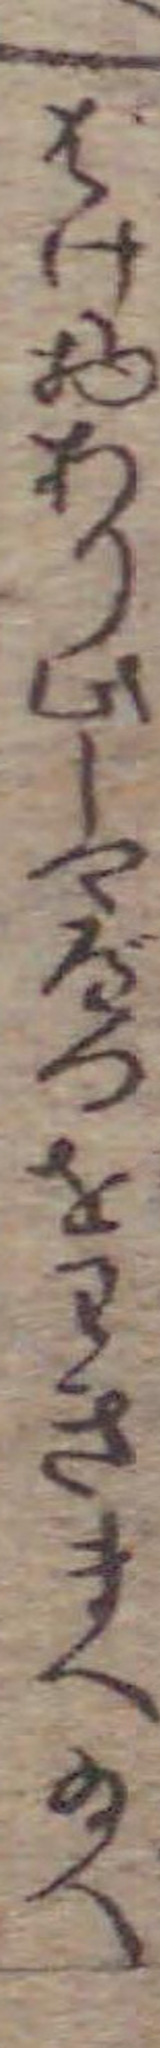はけ物あり此しやべつをわきまへ給へ

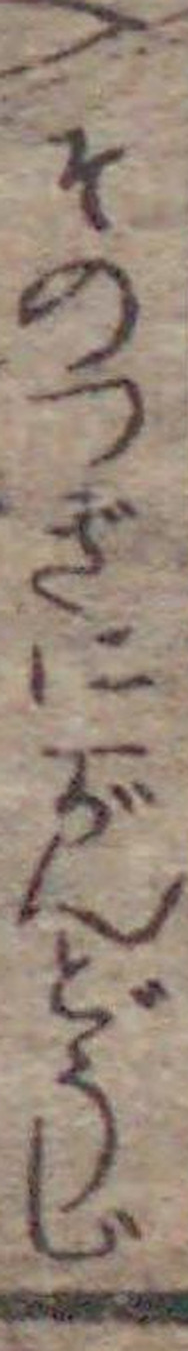そのつぎに一がんどうじ
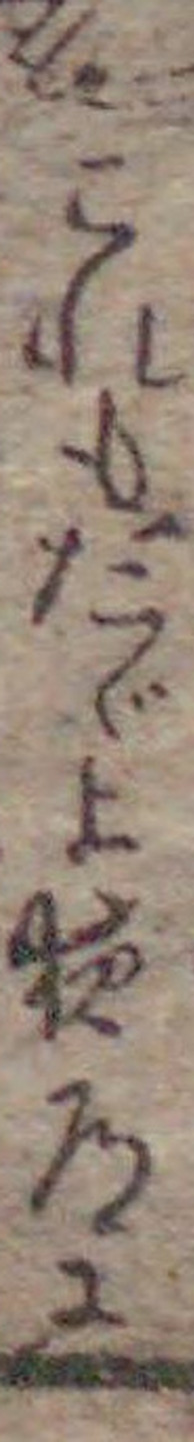これもたゞに夜道に
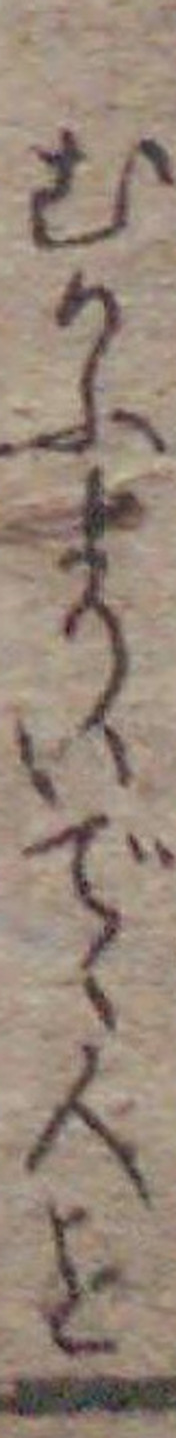むかふよりいでゝ人を
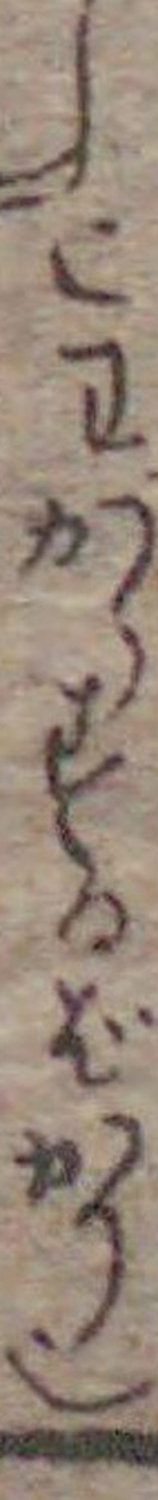こわからするばかり也
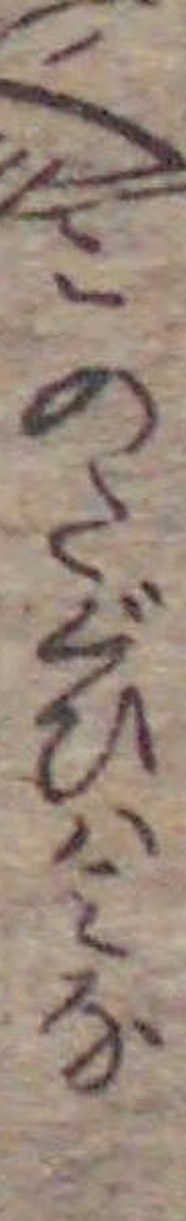このたぐいはみな
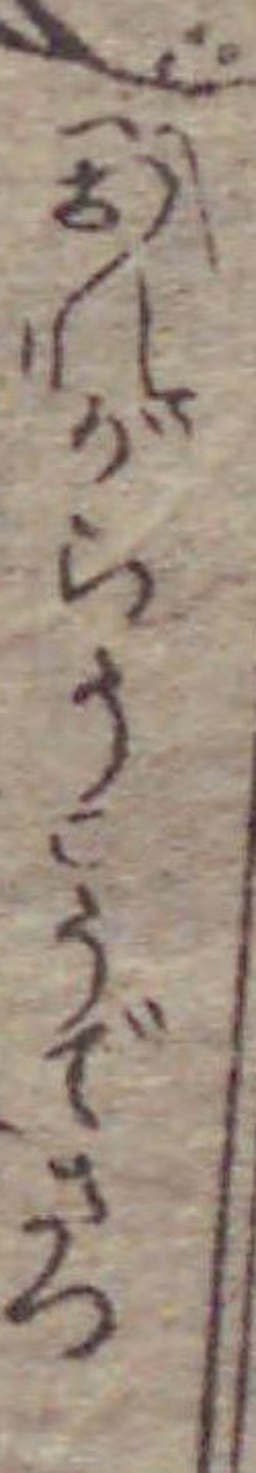〽おれがらうこうでさつ
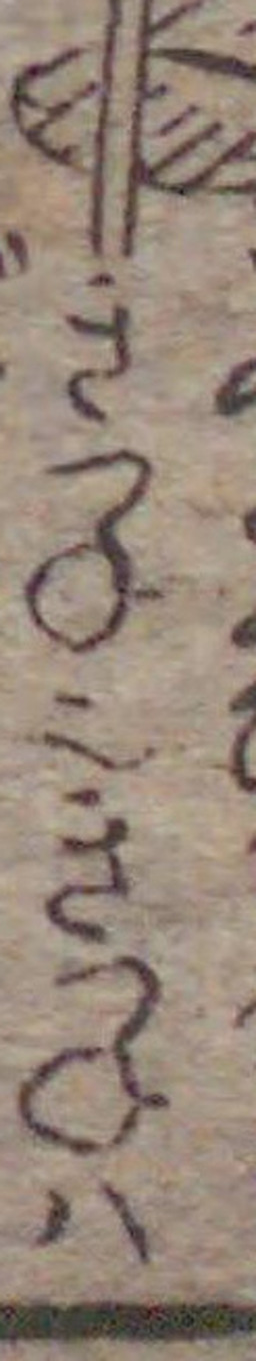きつね也きつねは
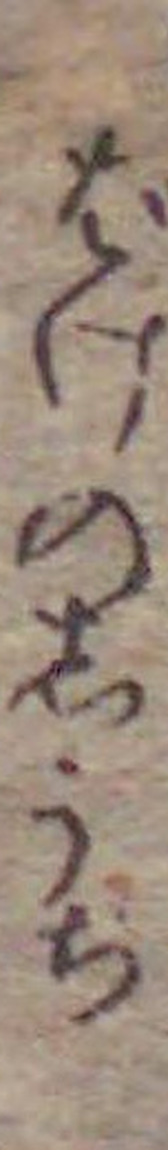ばけのしうち
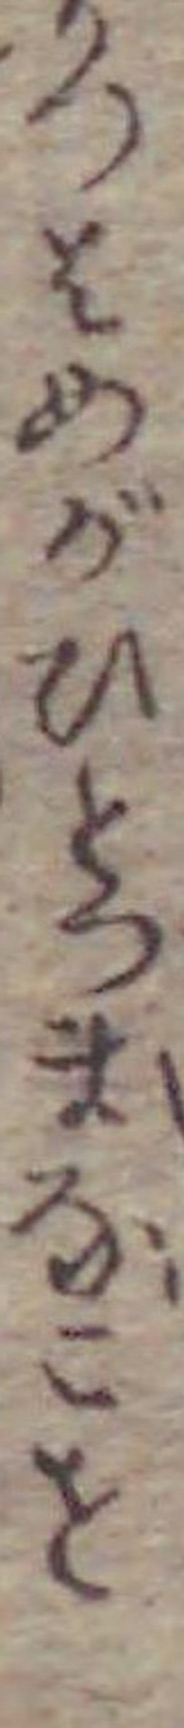かつはめがひとつまなこを
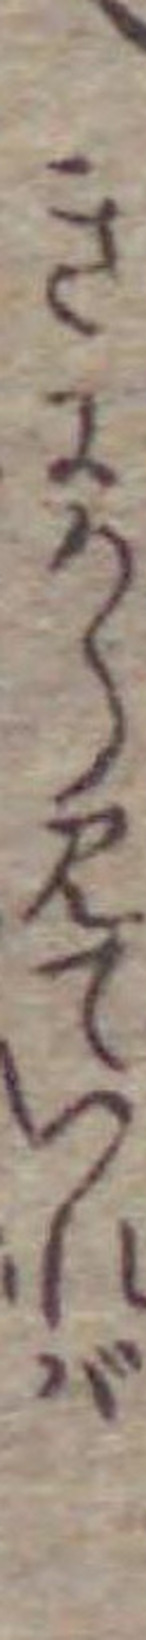きにから見ていれば
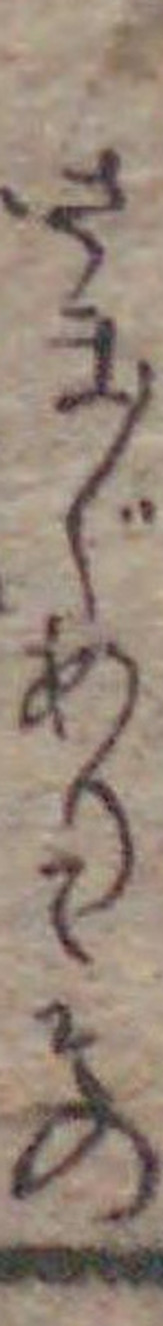さま〴〵ありてその
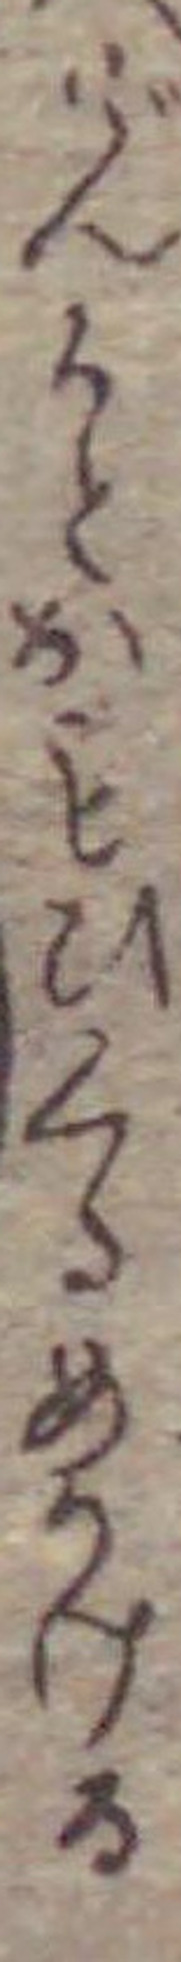人げんかとおもひくるめかける
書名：妖怪仕内評判記 : 2巻
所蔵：国立国会図書館 National Diet Library, JAPAN
